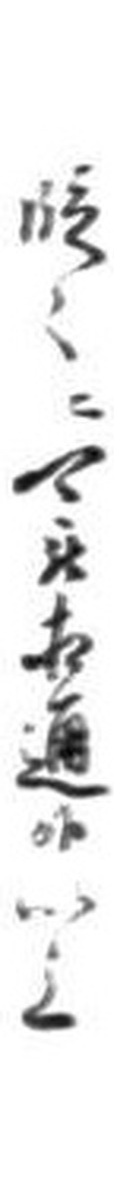段々ニ可被相通候以上
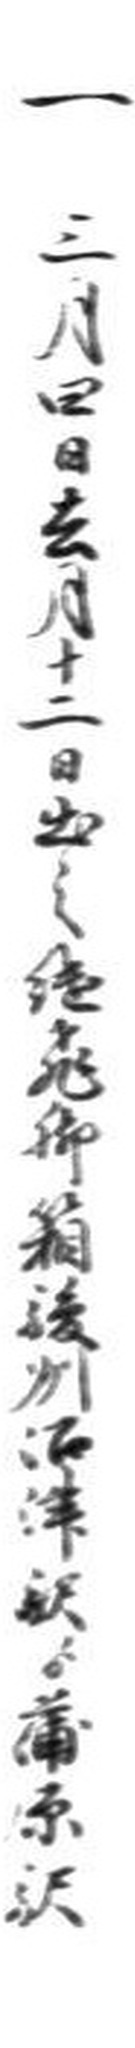一三月四日去月十二日出之継飛脚箱駿州沼津駅ゟ蒲原駅
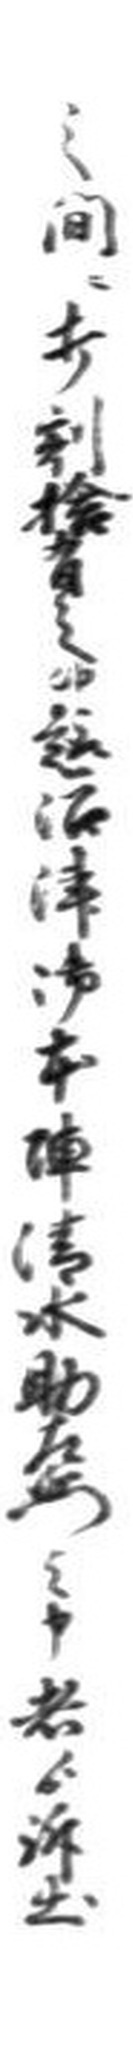之間ニ打刻捨有之候趣沼津御本陣清水助左衛門と申者ゟ訴出
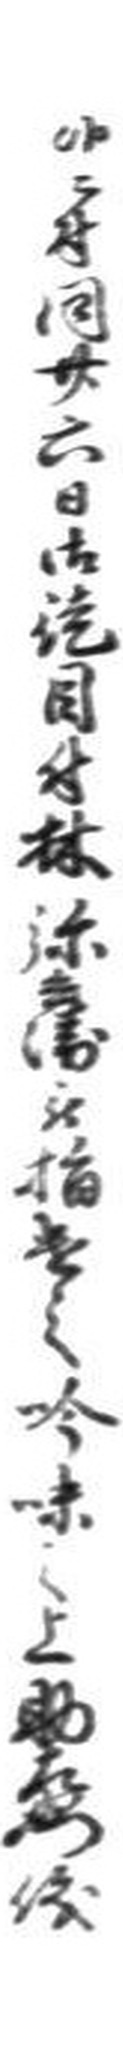候ニ付同廿六日御徒目付林弥兵衛被指遣之吟味之上助左衛門儀

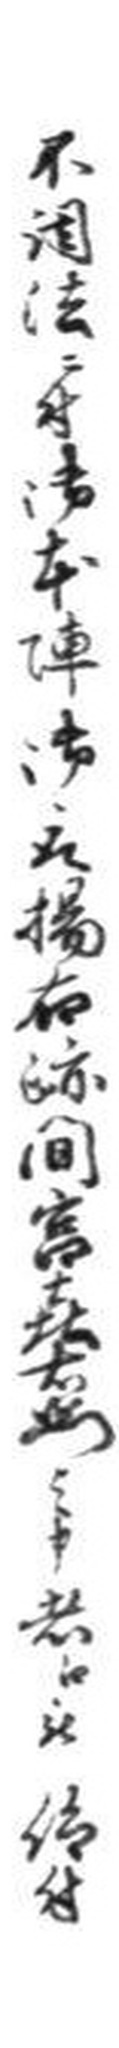不調法ニ付御本陣御取揚右跡間宮喜右衛門と申者江被仰付
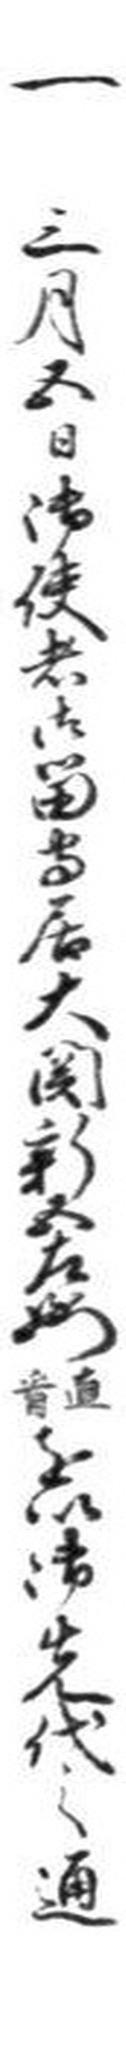一三月五日御使者御留守居大関新五左衛門直看を以御先代之通
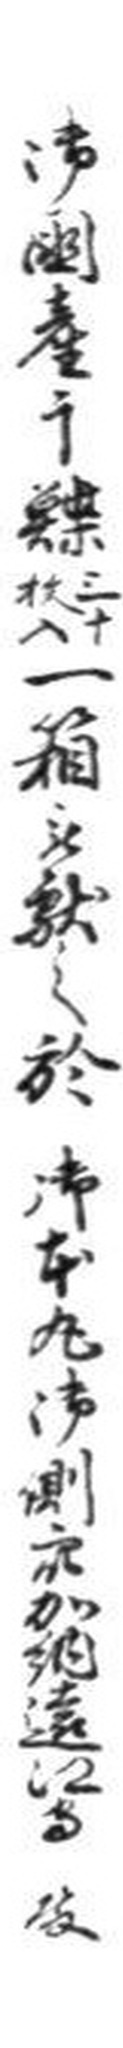御国産干鰈三十枚入一箱被献之於御本丸御側衆加納遠江守殿
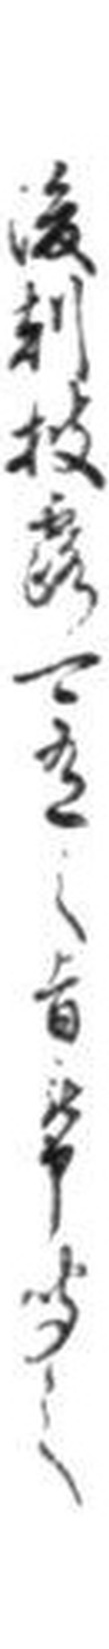後刻披露可有之旨被申聞之
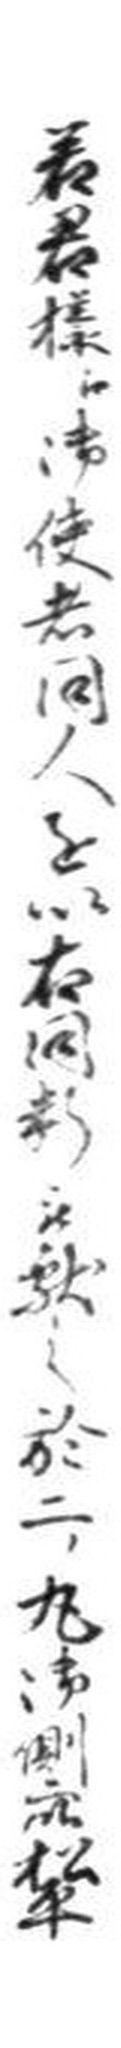若君様江御使者同人を以右同断被献之於二ノ丸御側衆松平
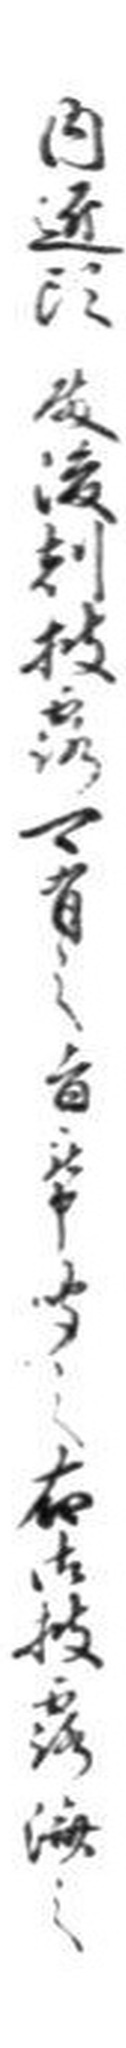内匠頭殿後刻披露可有之旨被申聞之右御披露済之
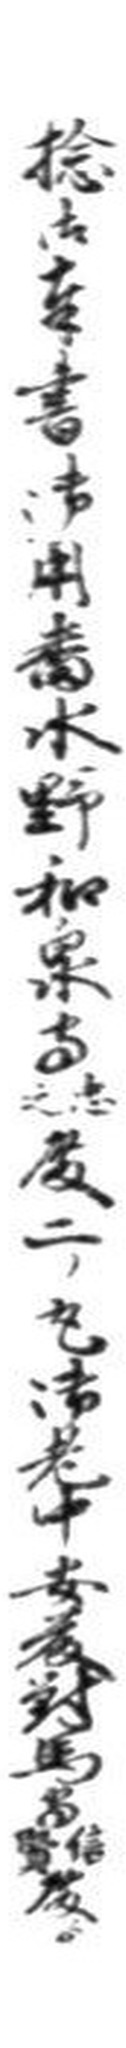捻御奉書御用番水野和泉守忠之殿二ノ丸御老中安藤対馬守信賢殿ゟ
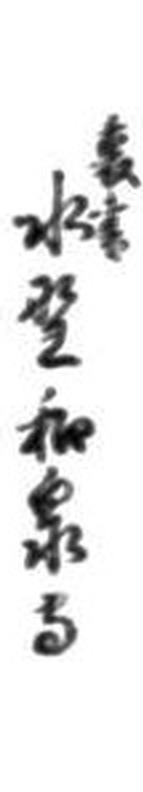水野和泉守
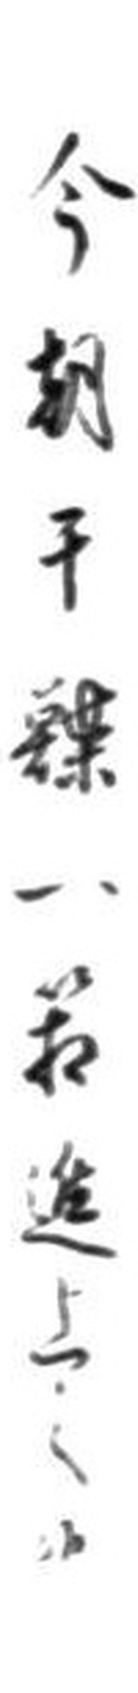今朝干鰈一箱進上之候
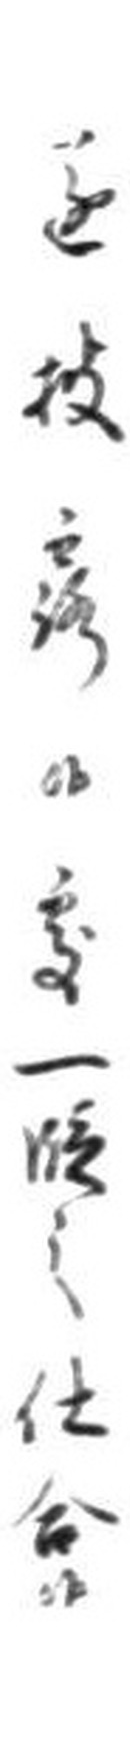遂披露候処一段之仕合候
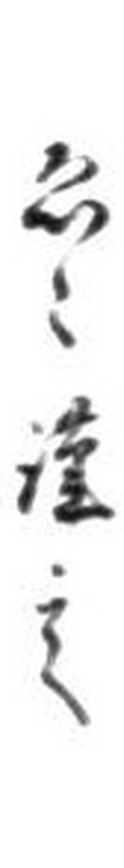恐々謹言
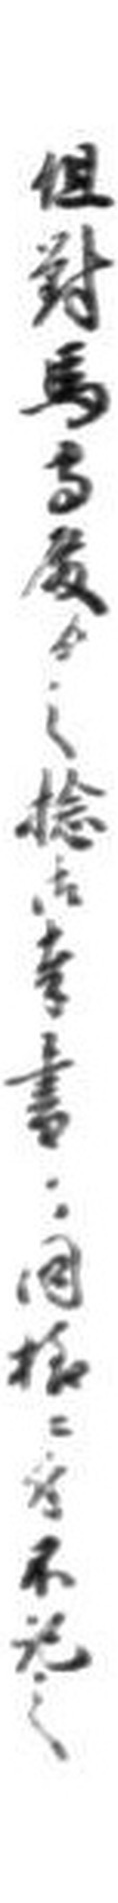但対馬守殿ゟ之捻御奉書も同様ニ付不記之
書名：家譜 三十九 宗矩公 享保十年
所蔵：福井県文書館 Fukui Prefectural Archives
